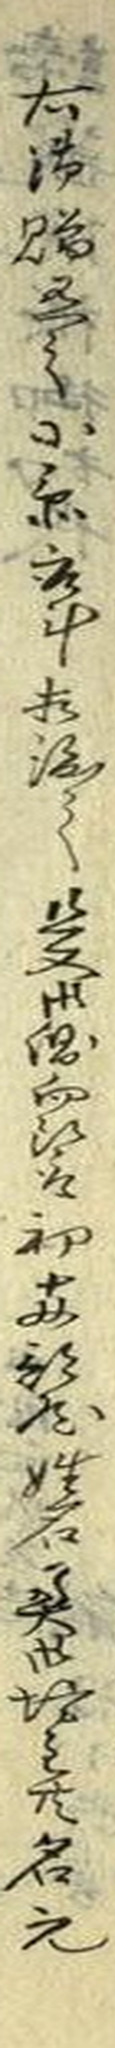右御贈有之小兵衛取計相渡之且又御側向頭取初両部屋姓名奥坊主共名元
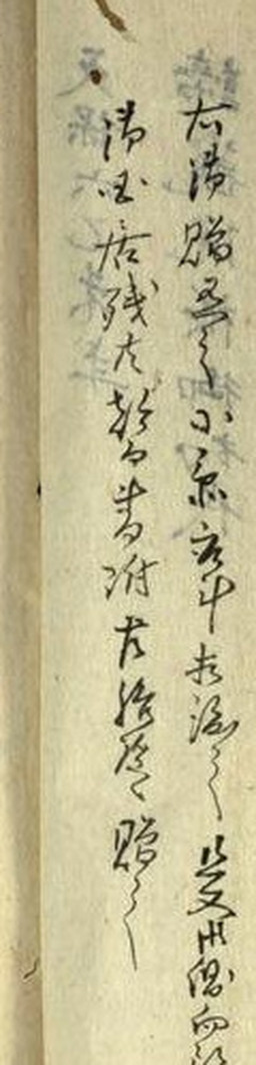御国居残共都而書附左膳殿へ贈之
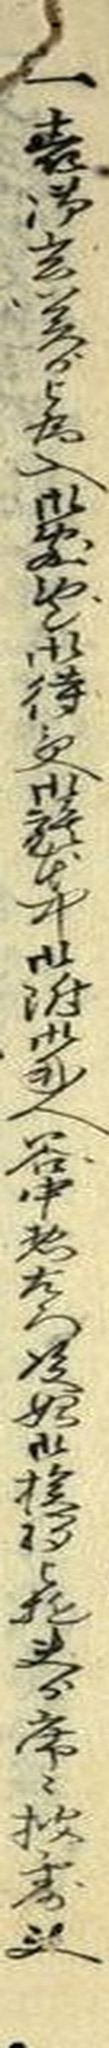一表御玄関ゟ被為入御敷台御待受御旗本中御附御用人谷中惣左衛門殿始御挨拶被遊夫ゟ席々披露夫
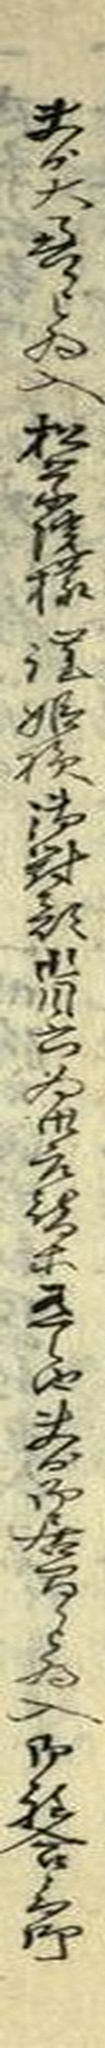夫ゟ大奥へ被為入松栄院様謹姫様御対顔御目六為御取替等有之由夫ゟ御居間へ被為入御程合ニ而御
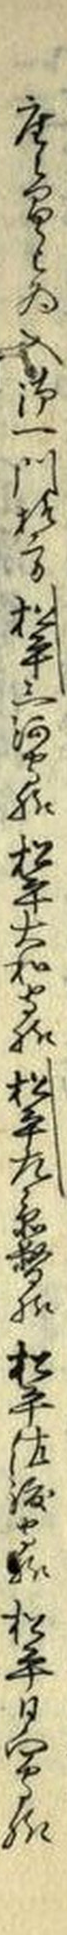座之間へ被為入御一門様方松平三河守様松平大和守様松平左兵衛督様松平佐渡守様松平日向守様
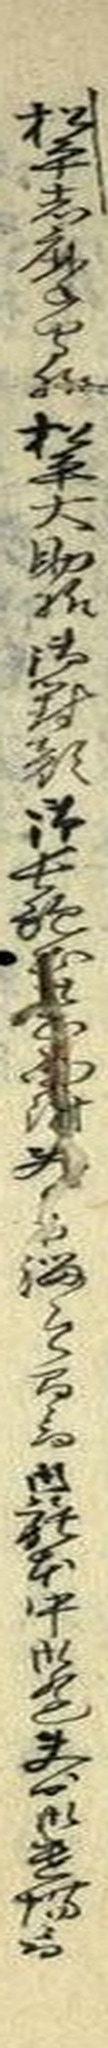松平志摩守様松平大助様御対顔御長鮑出御正面附夫ゟ溜之間ニ而御旗本中御逢夫ゟ御遣場ニ而
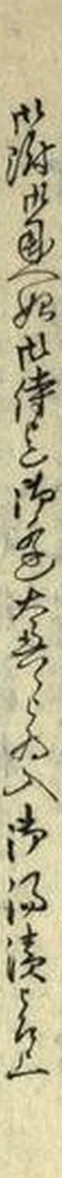御附御用人始御侍迄御逢大奥へ被為入御湯漬被召上
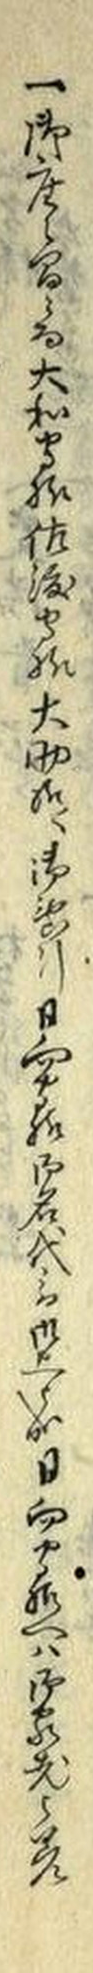一御座之間ニ而大和守様佐渡守様大助様へ御台引日向守様御名代ニ而御上被成日向守様ヘハ御家老被差
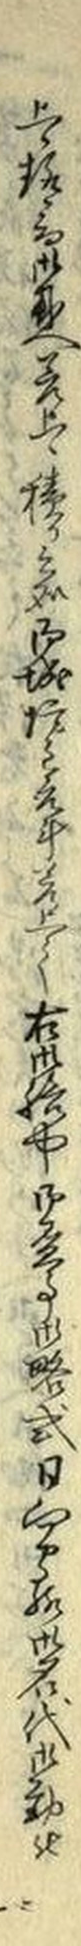上候趣ニ而御用人差上候積り之処御城坊主取計差上之右御膳中御盃事御略式日向守様御名代御勤被
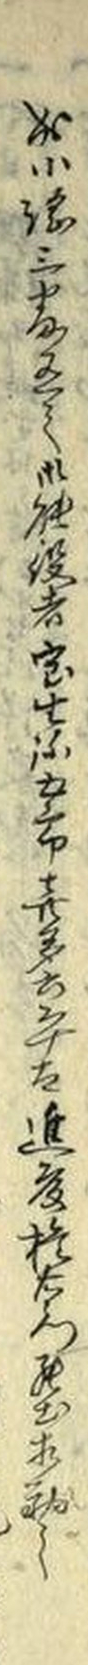成小謡三番有之御能役者宝生弥五郎喜多六平太進藤権右衛門罷出相勤之
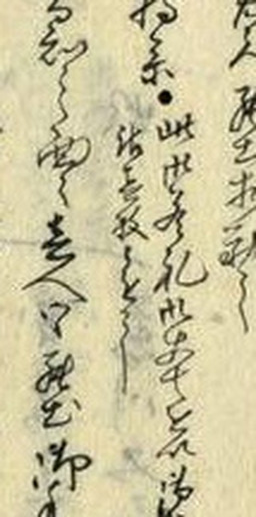銀壱枚被進之
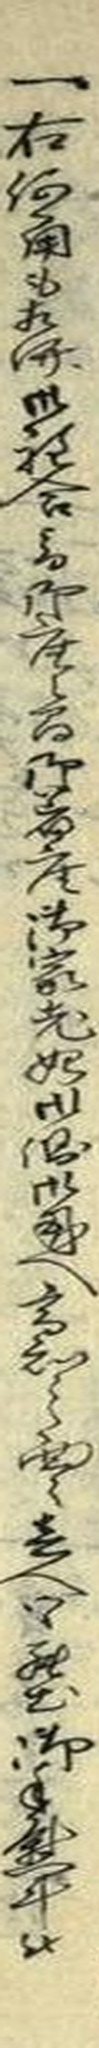一右何角も相済御程合ニ而御座之間御着座御家老始御側御用人高知之面々壱人ツヽ罷出御手熨斗被
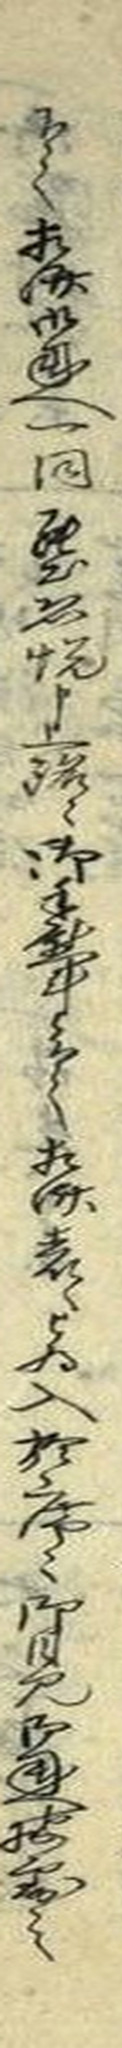下之相済御用人一同罷出恐悦申上銘々御手熨斗被下之相済表へ被為入於席々御目見御用人披露之
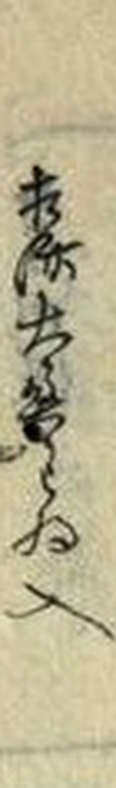相済大奥へ被為入
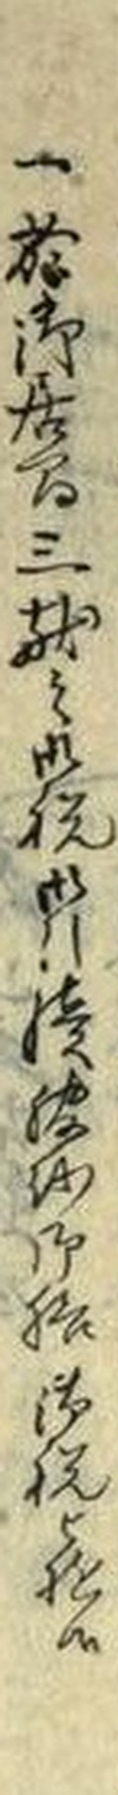一於御居間三献之御祝御引続服紗御膳御祝被遊候

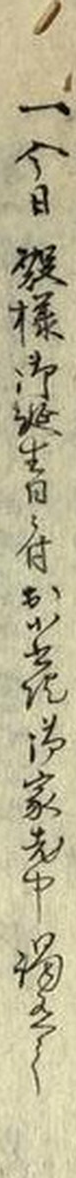一今日殿様御誕生日ニ付於小書院御家老中謁有之
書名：少傅日録抄（斉善付側向頭取日記、在府）
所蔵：福井県文書館 Fukui Prefectural Archives
